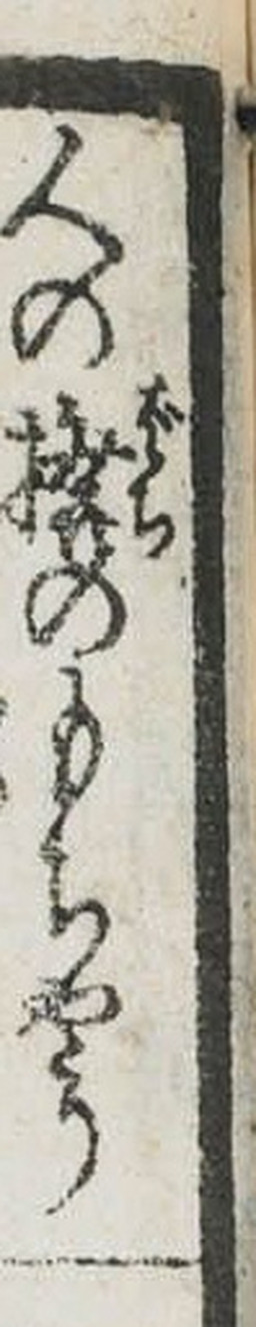人の撥のもちやう
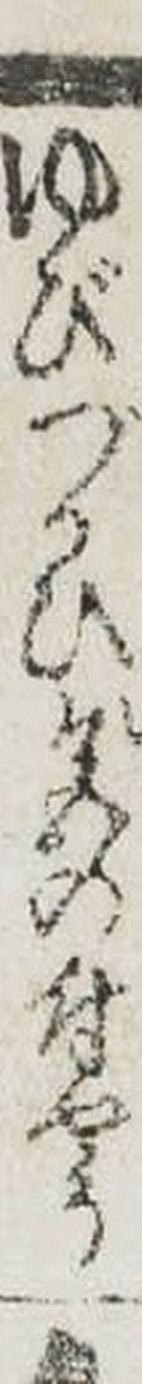ゆびづかひ色の付やう
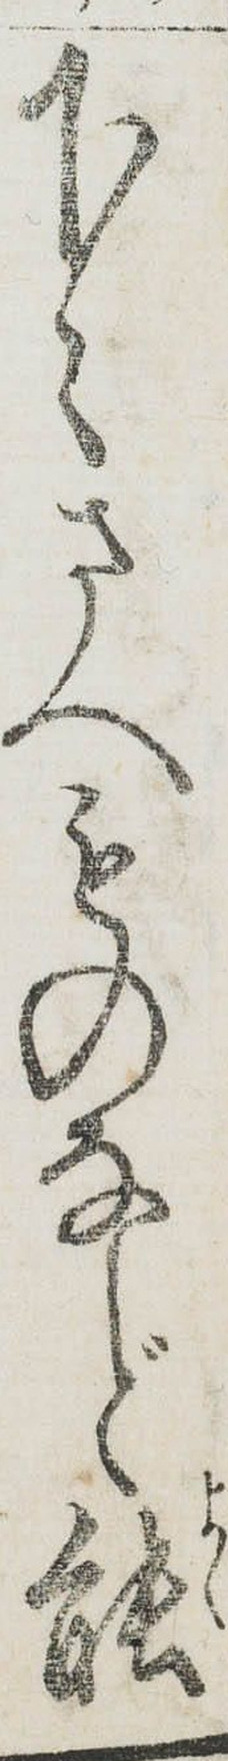下々さへものなど能
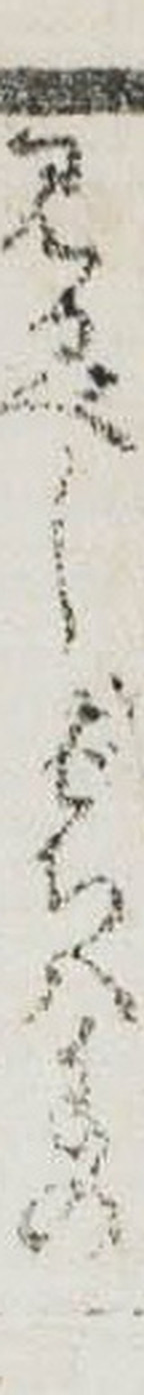見るべしばちは手の
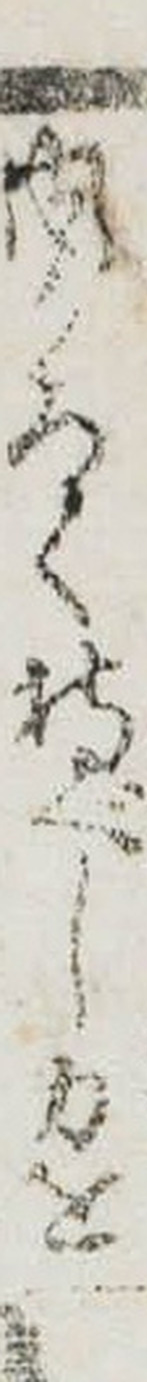内かるく持べし力を
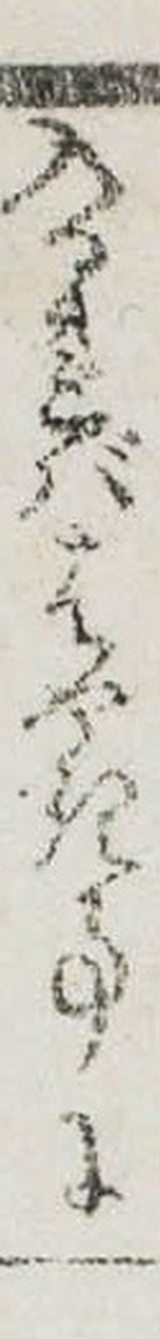入るればはやき事に
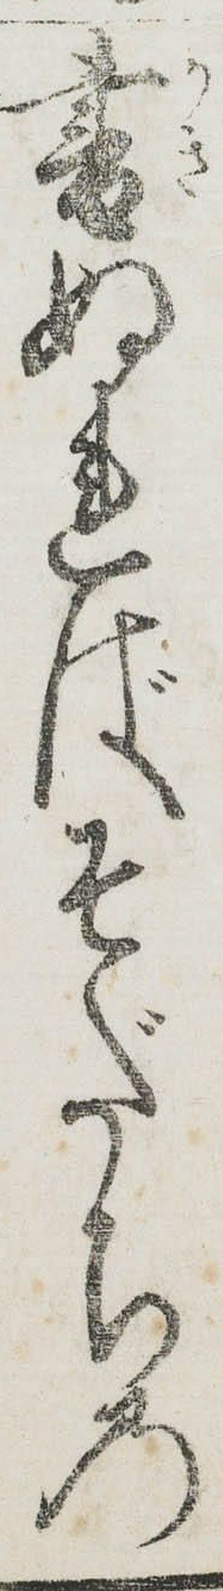書ぬればそだちの
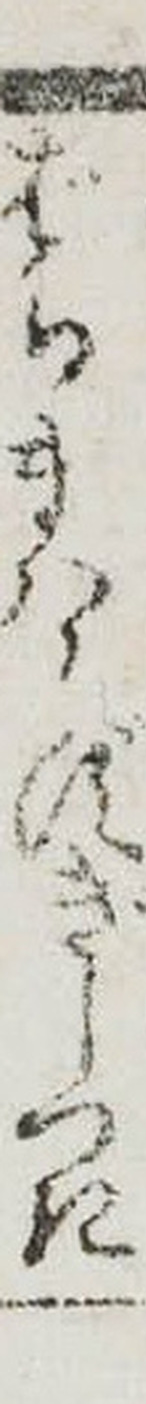ばちまはらずぎしつき
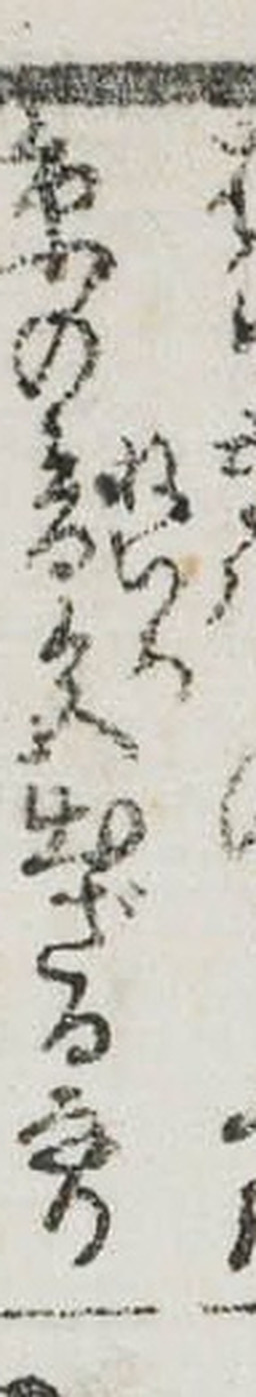糸の音色出ざるなり
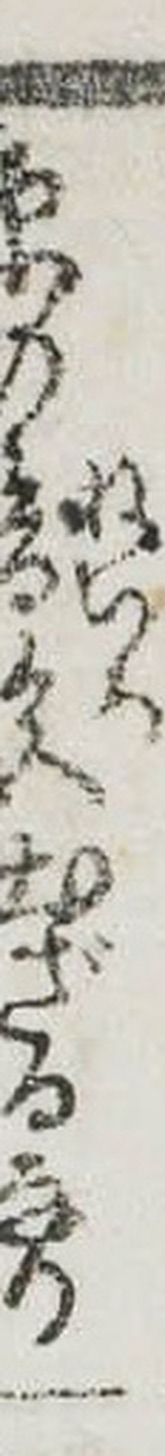糸の音色出ざるなり
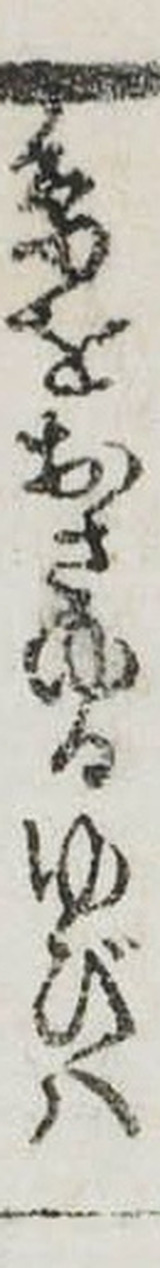糸をおさゆるゆびは
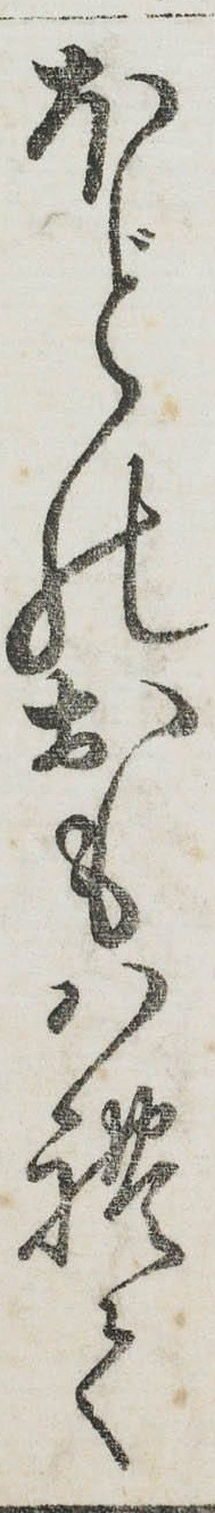ほどのおもはれて
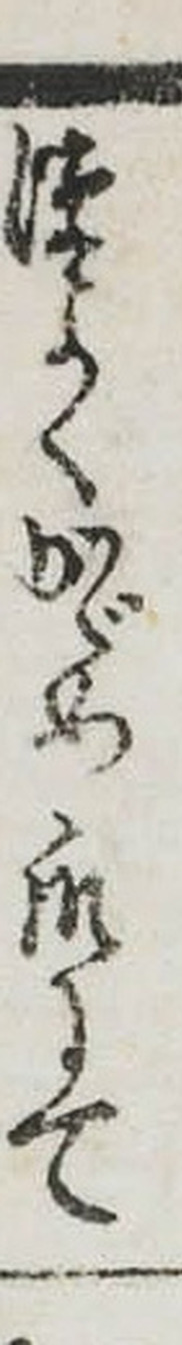つよくかゞめ爪にて
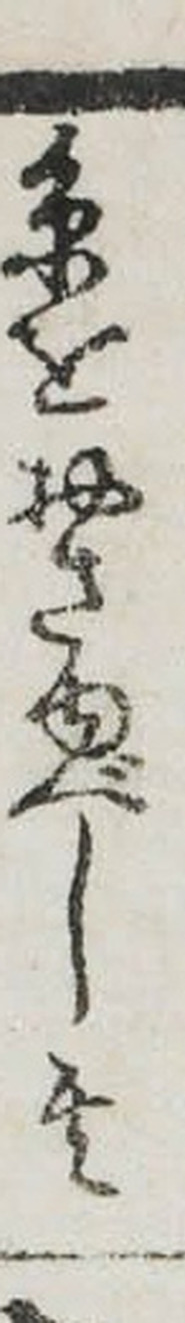糸をおさゆべし其
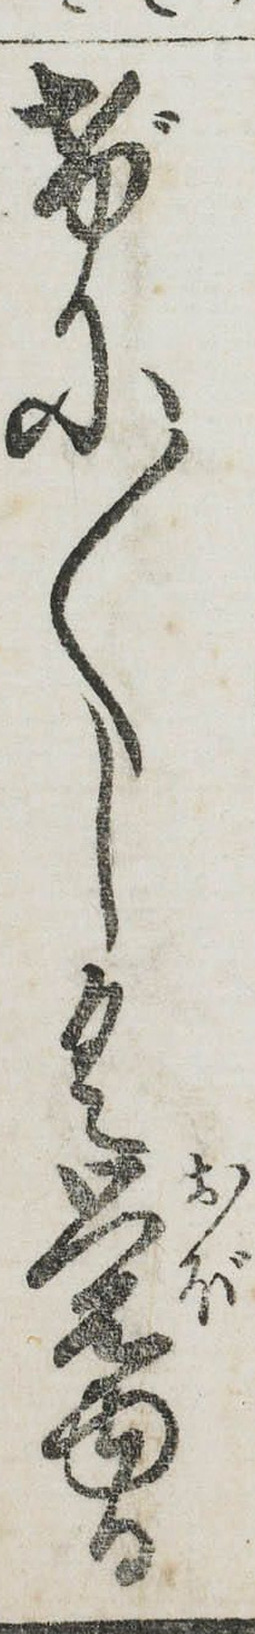げにくしく覚ゆる
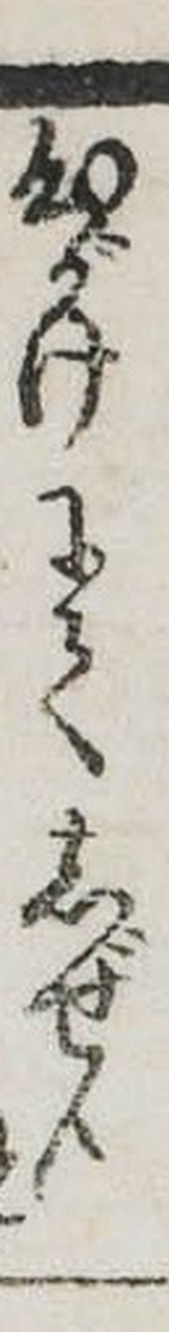心がけにてしぜんと
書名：頭書萬用婦人手紙之文言
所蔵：東京学芸大学教育コンテンツアーカイブ
